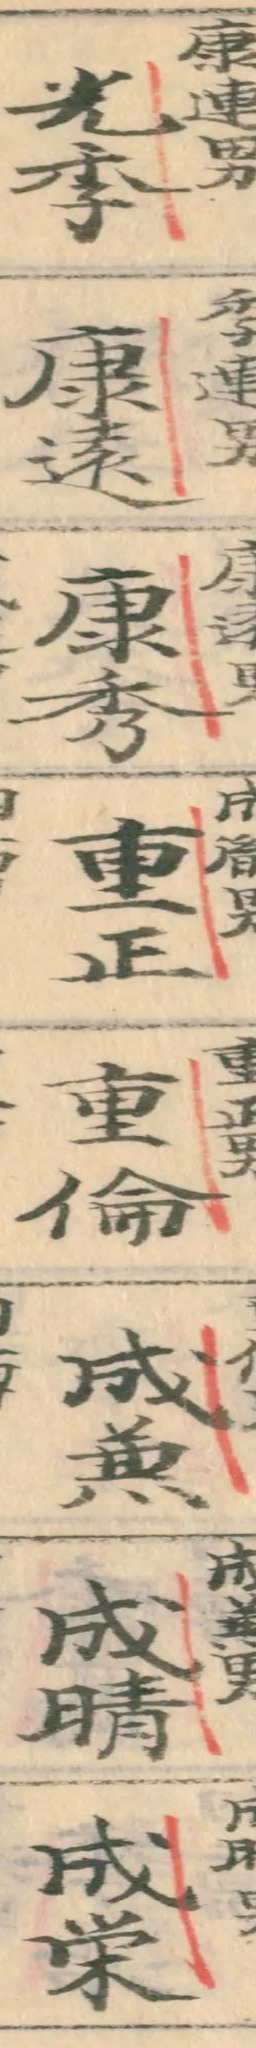光季康遠康秀重正重倫成兼成晴成栄
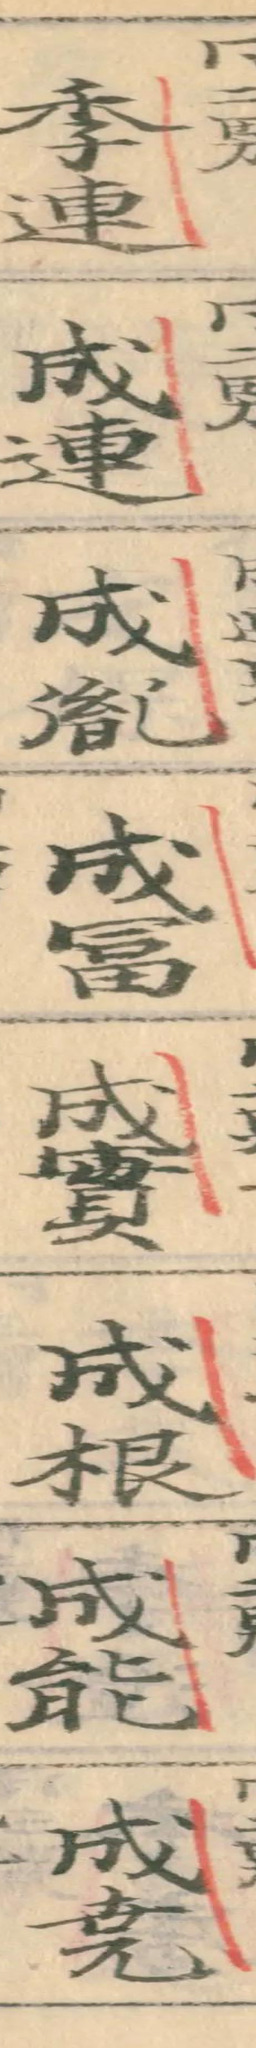季連成連成胤成富成實成根成能成尭
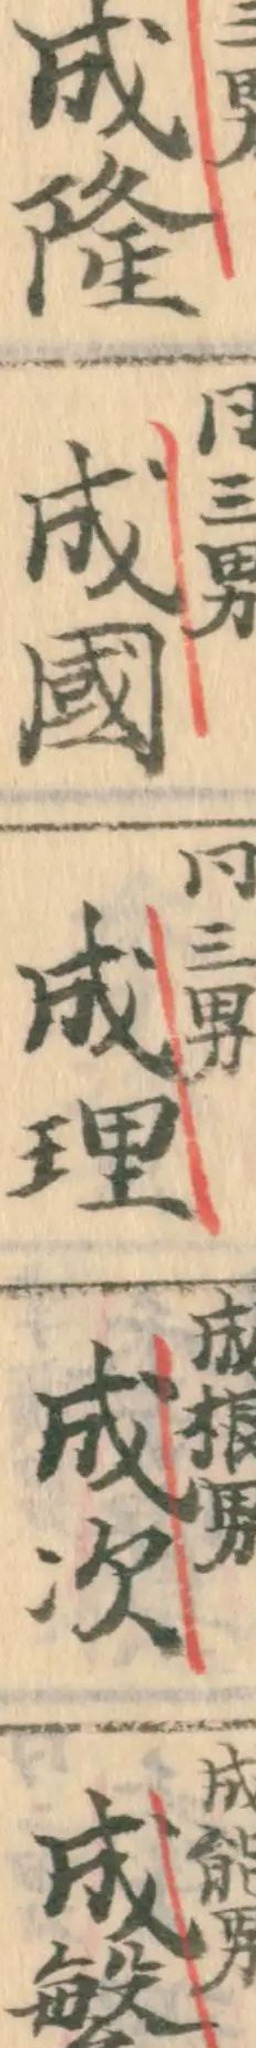成隆成国成理成次成繁
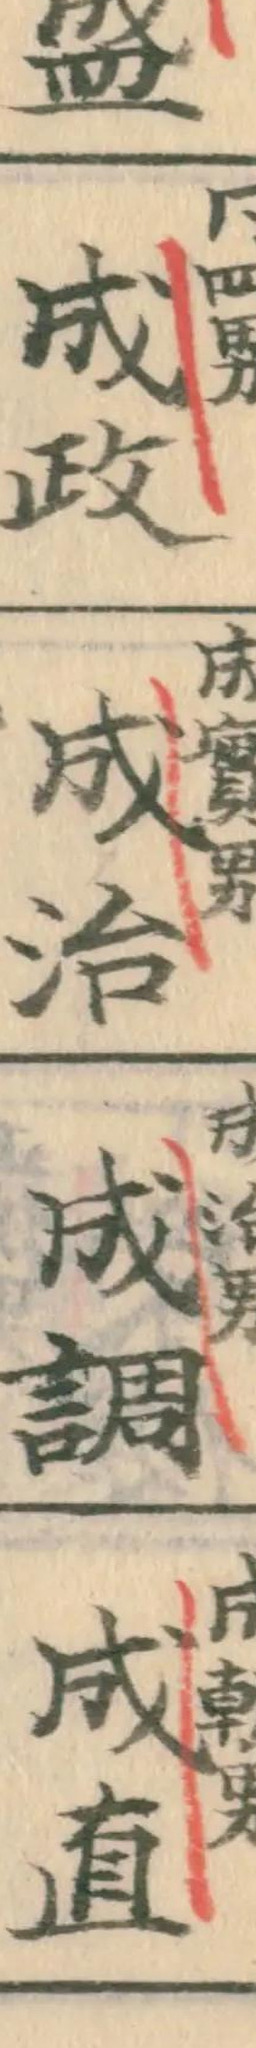成盛成政成治成調成直
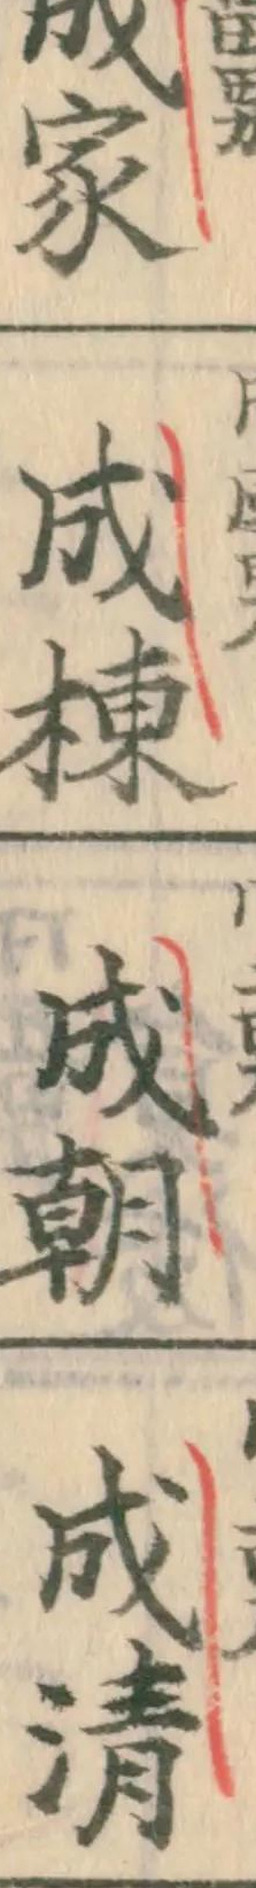成家成棟成朝成清
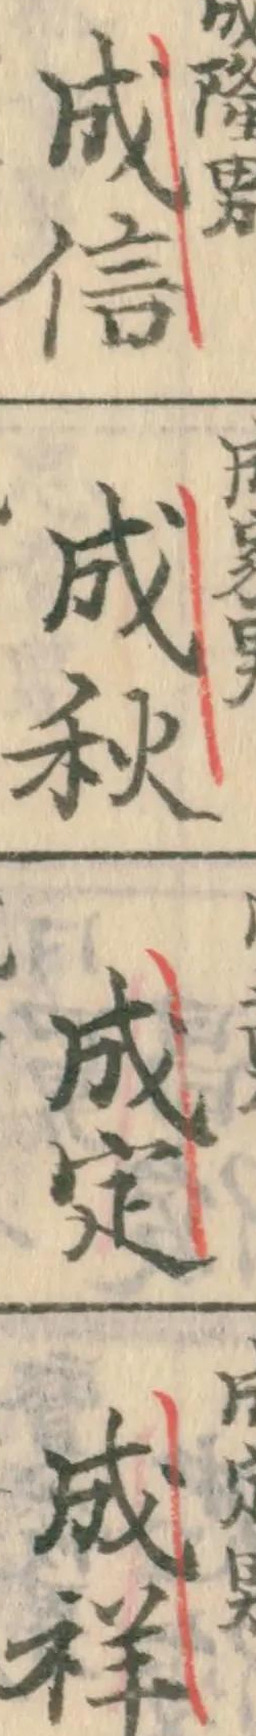成信成秋成定成祥
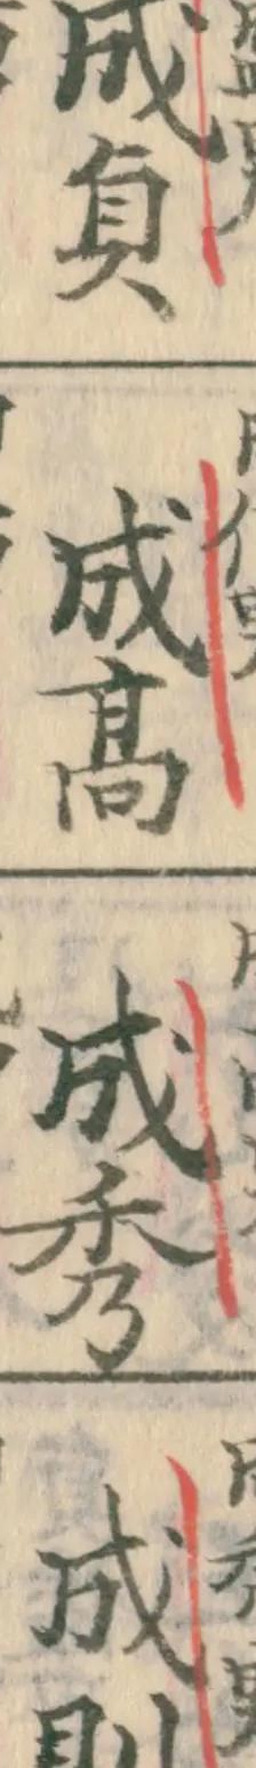成貞成髙成秀成則
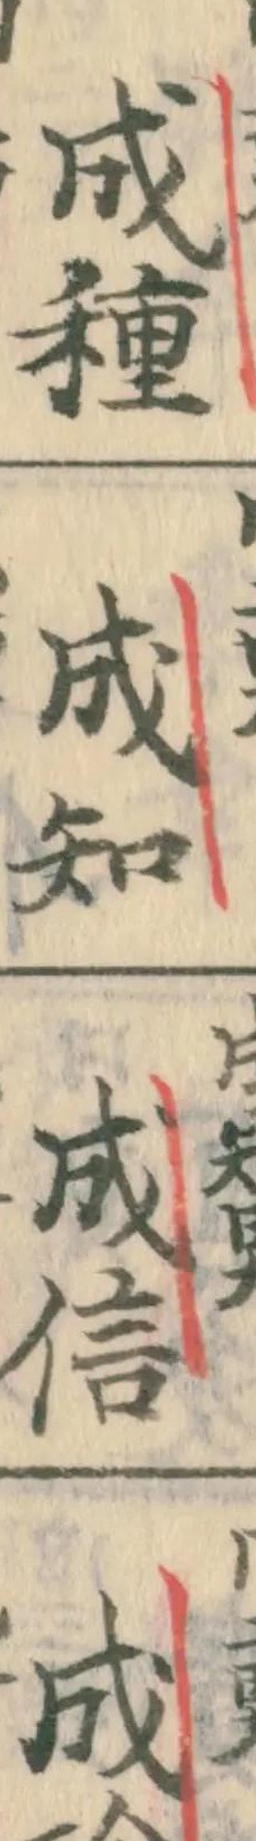成種成知成信成珍
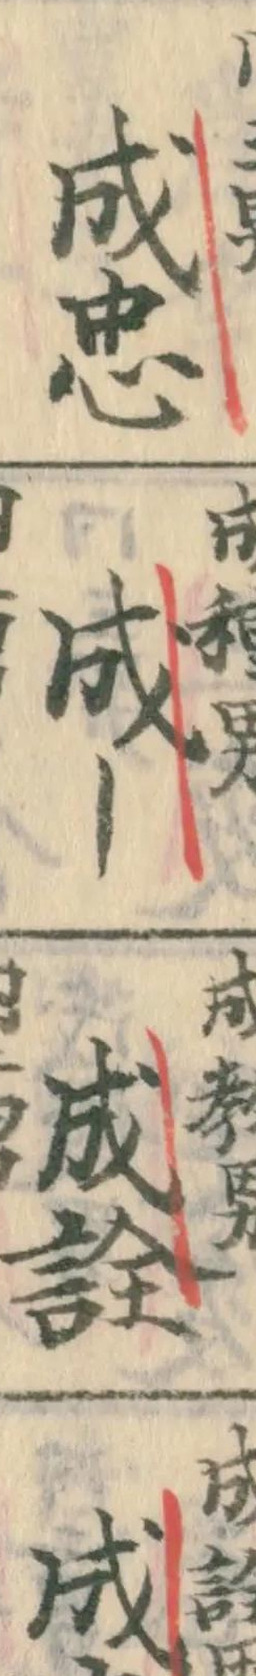成忠成ー成詮成房

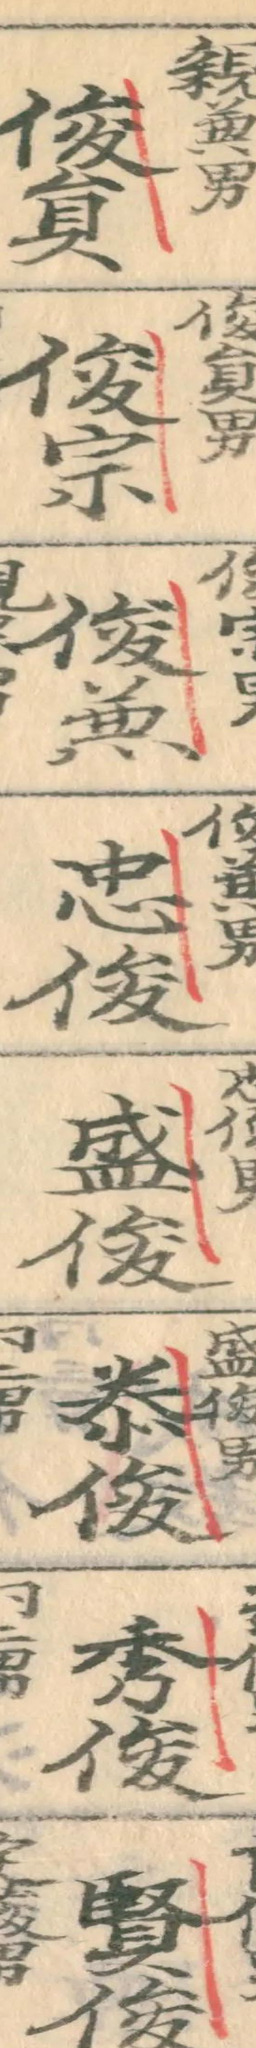俊員俊宗俊兼忠俊盛俊泰俊秀俊賢俊
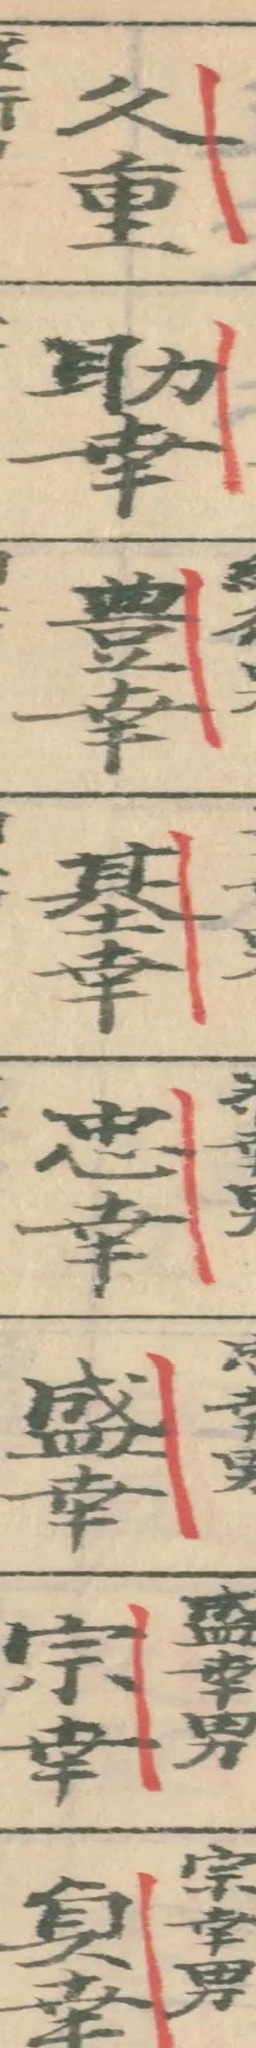久重助幸豊幸基幸忠幸盛幸宗幸貞幸
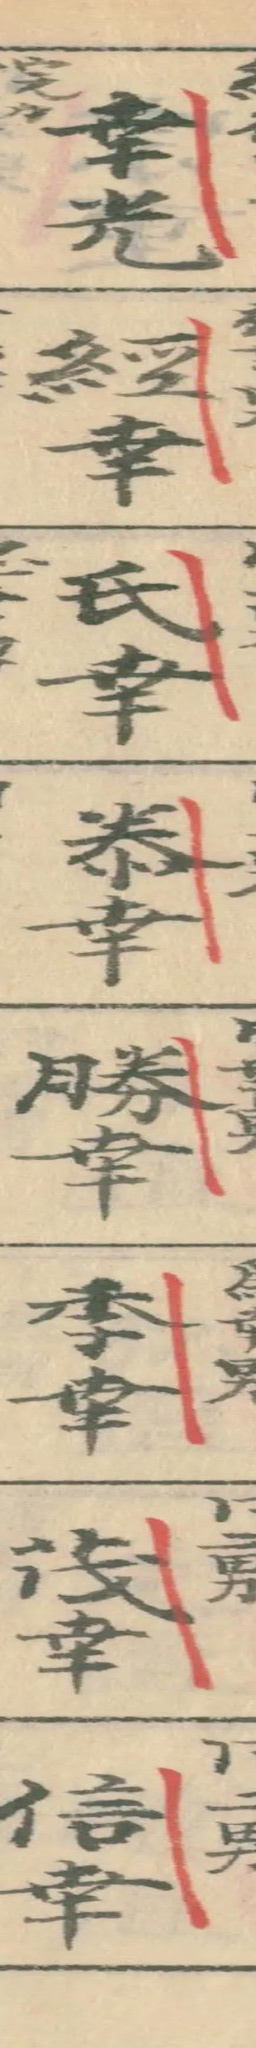幸光経幸氏幸恭幸勝幸季幸茂幸信幸

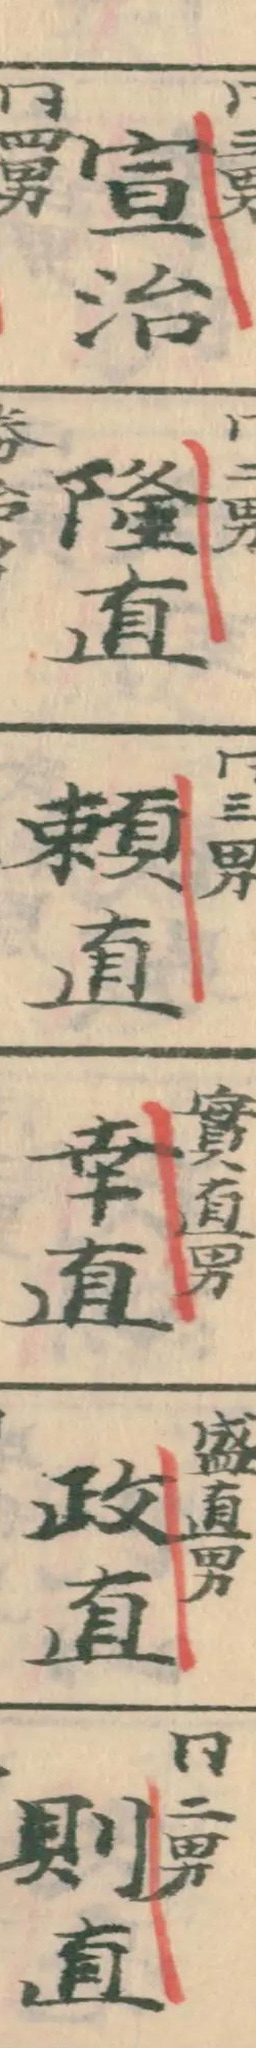宣治隆直賴直幸直政直則直
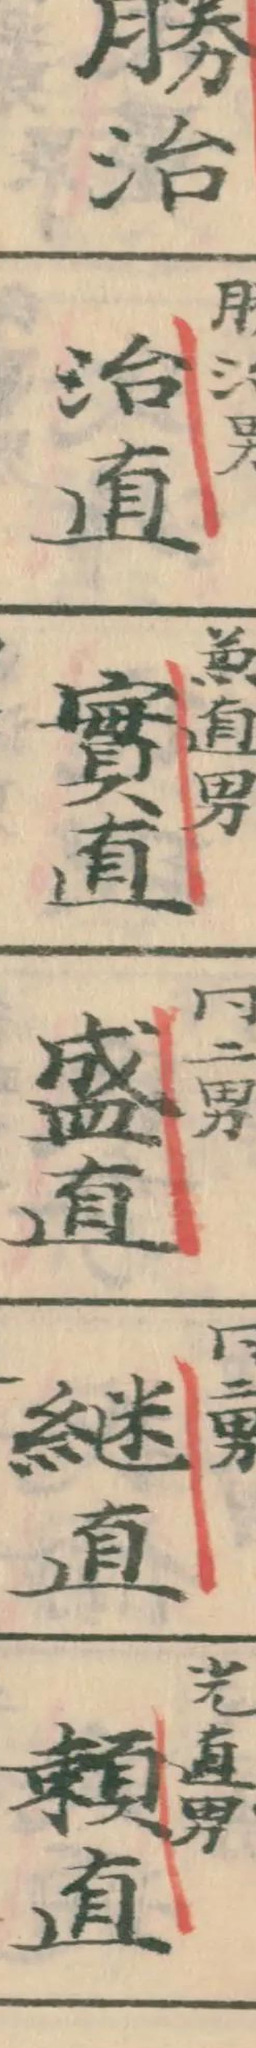勝治治直實直盛直継直賴直
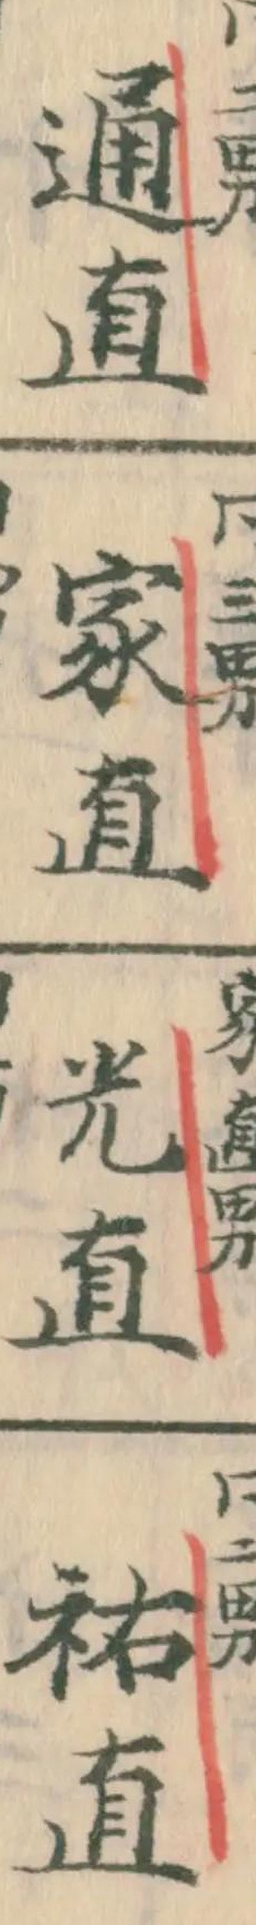通直家直光直祐直
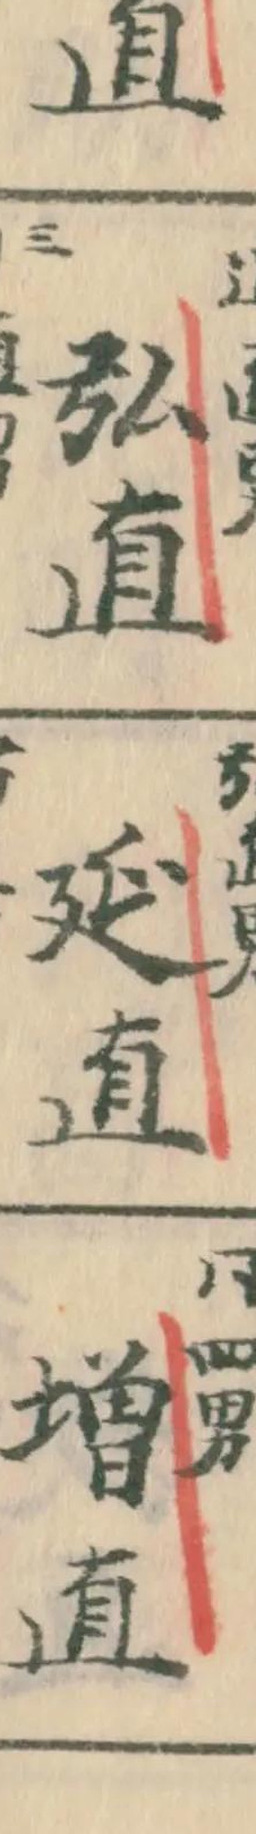ー直弘直延直増直
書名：賀茂社記録. 第24冊
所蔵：国立国会図書館 National Diet Library, JAPAN
